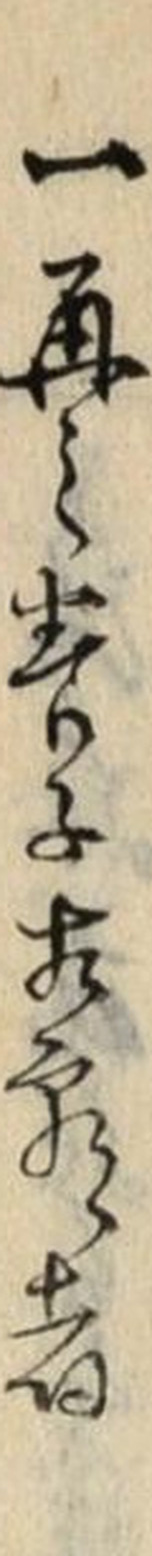一再々養子相願候者
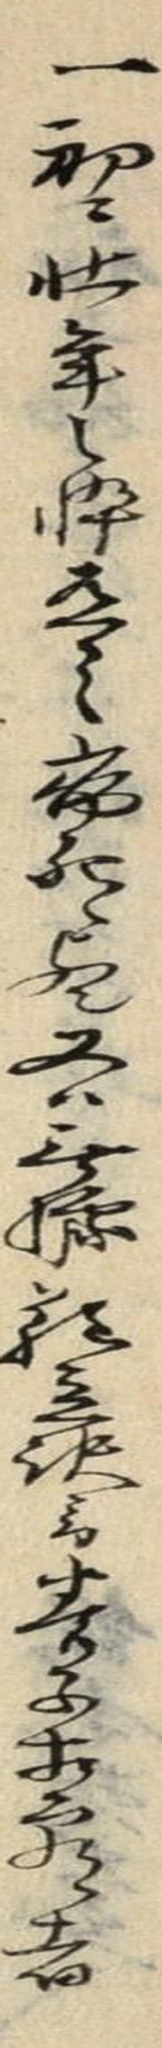一初ニ壮年之忰有之病死候歟又ハ無拠難立訳ニ而養子相願候者
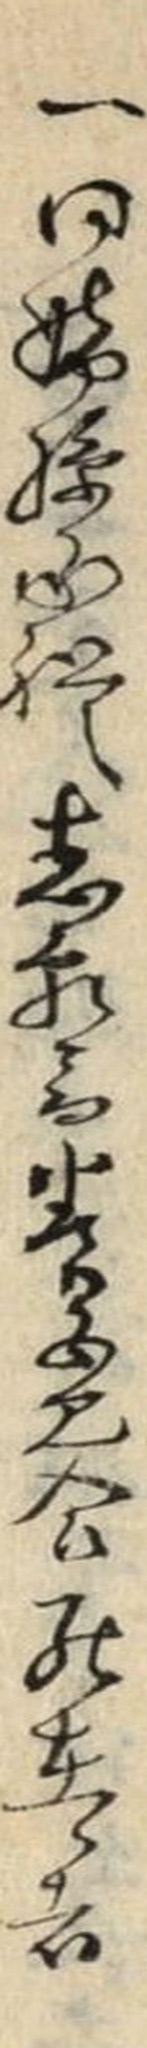一同嫡孫承祖之志願ニ而養子見合罷在候者
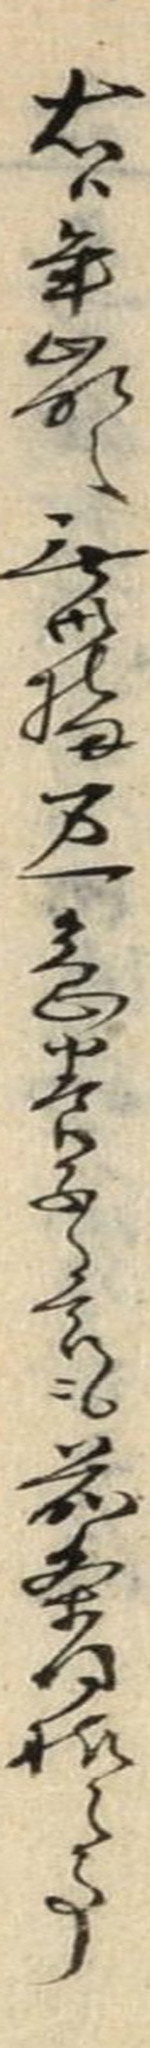右ハ年齢之無御構万一急養子之節も前条同様之事
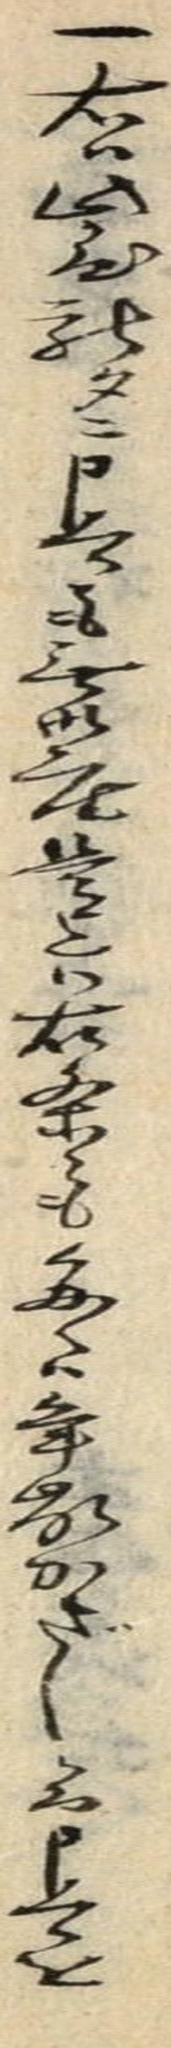一右ハ此度新タニ申上候ニも無御座是迄ハ右条ニも多くハ年齢かざし候而申上候を
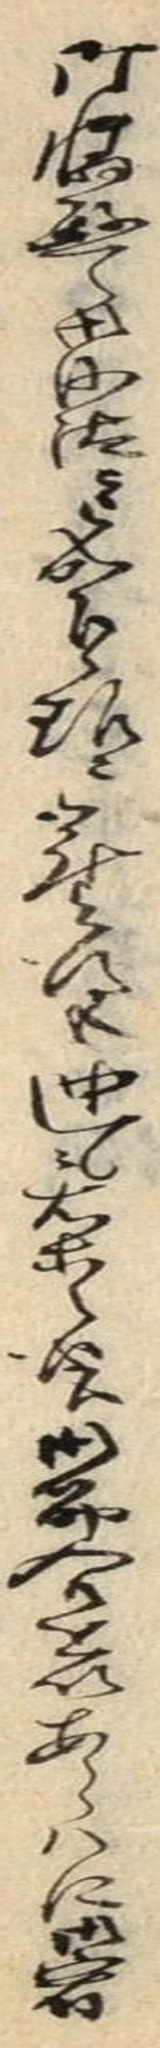御憐愍之御沙汰ニ被成下候趣ニ御座候得共迚も右等之儀ハ御筋合を以あらハに御宥
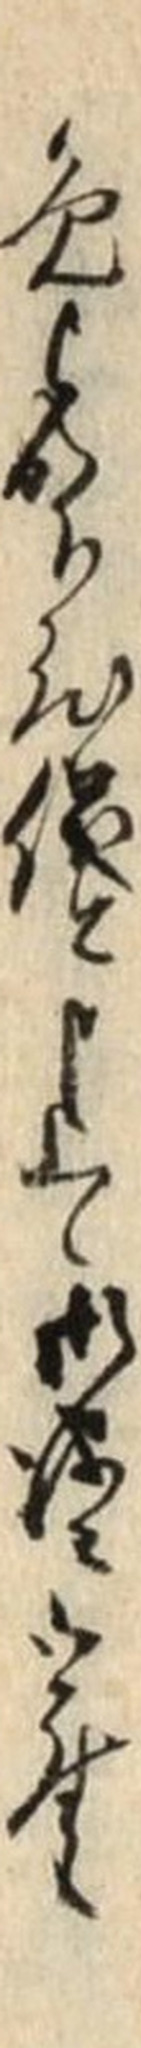免被成下度儀と申上候御儀ニ御座候
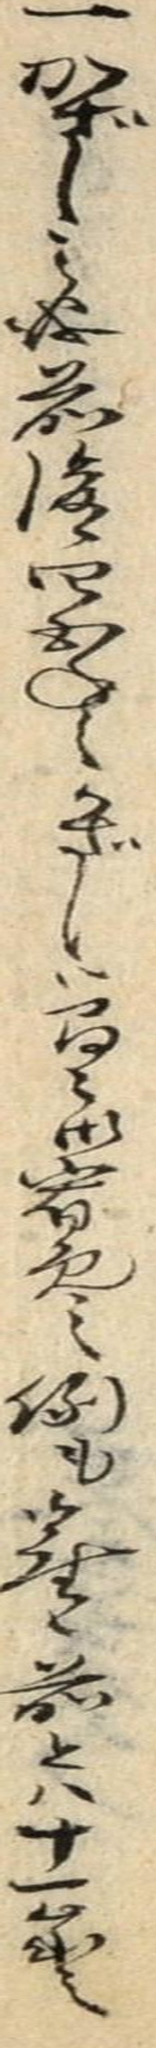一かざし之儀前後し四五年かざし候ハ間々御宥免之例も御座候前とハ十一歳之
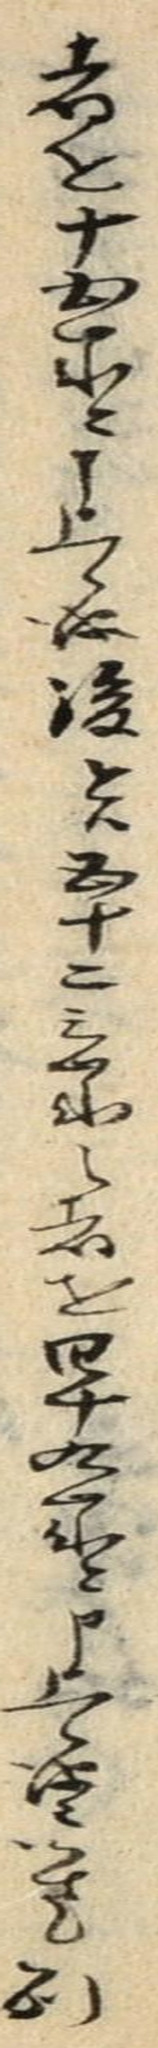者を十五歳と申上候儀後とハ五十二三歳之者を四十九歳と申上候儀ニ御座候別
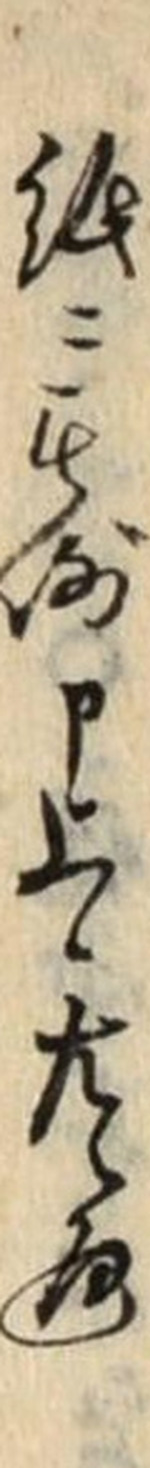紙ニ其例申上候左之通

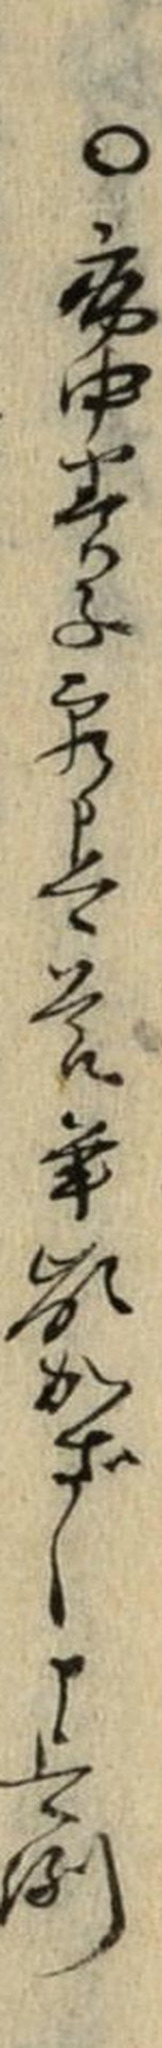〇病中養子願申上候節年齢かざし申上候例
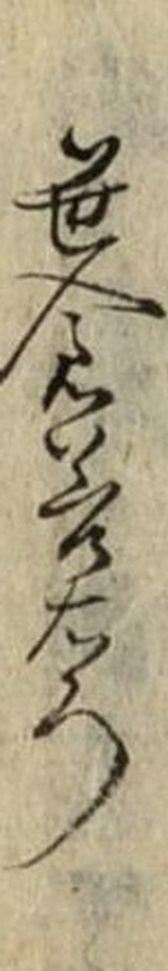同笹倉善右衛門
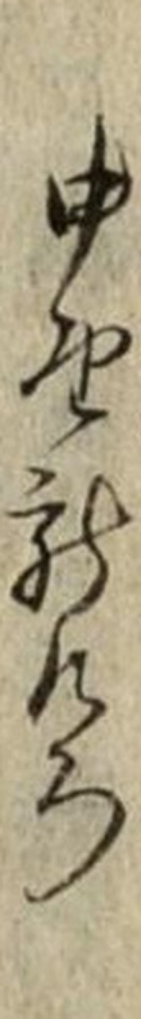同中野新左衛門
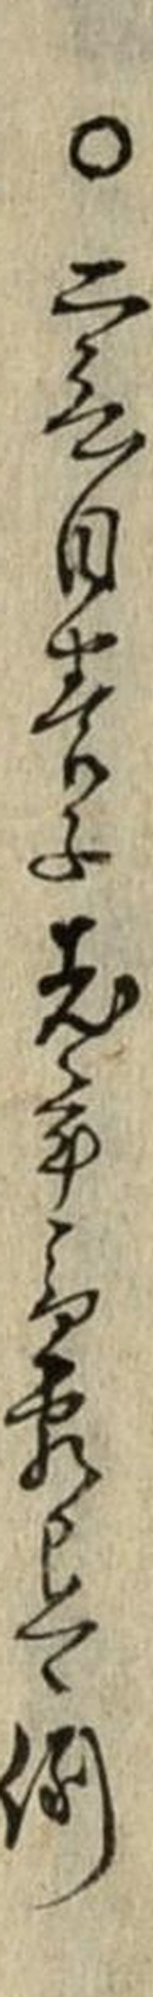〇ニ度目養子老年ニ而願申上候例
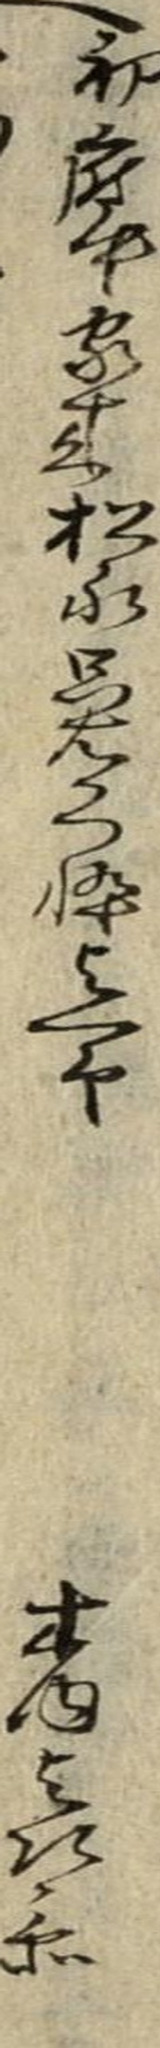初府中家来松永只右衛門忰与一郎木内与次兵衛
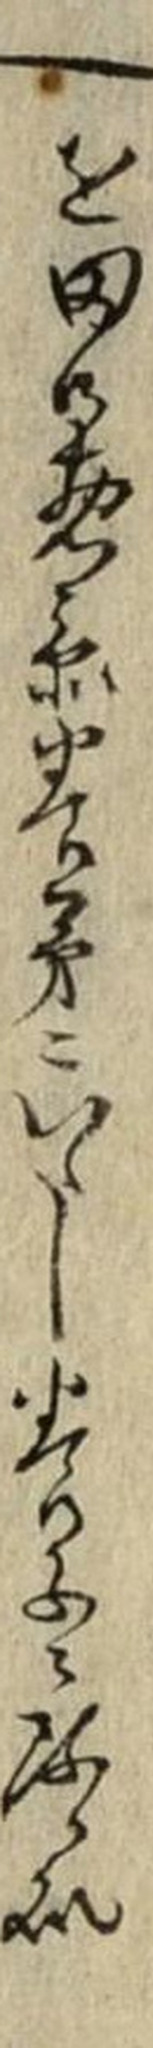を田口惣兵衛養弟ニいたし養子ニ改候処
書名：養子縁組之部
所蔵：福井県文書館 Fukui Prefectural Archives
